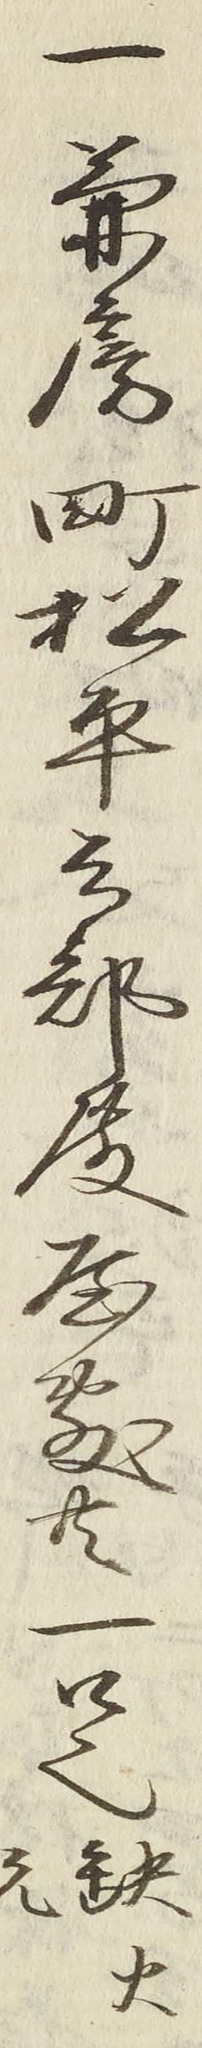一兼房町松平兵部殿屋敷共一口也缺火元
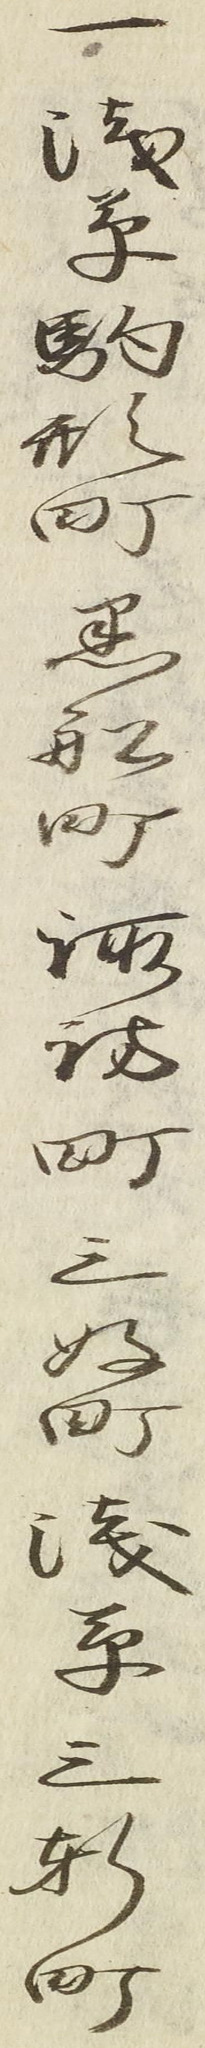一浅草駒形町黒船町諏訪町三好町浅草三軒町
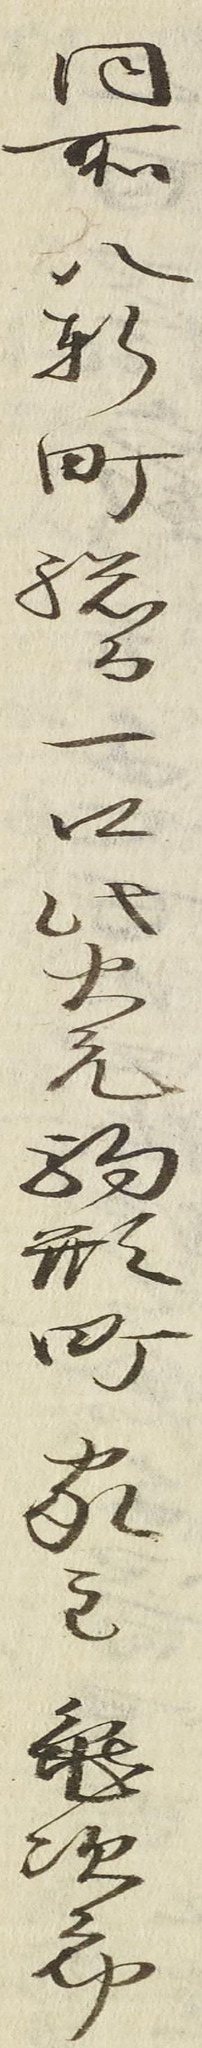同所八軒町総て一口此火元駒形町家主亀次郎
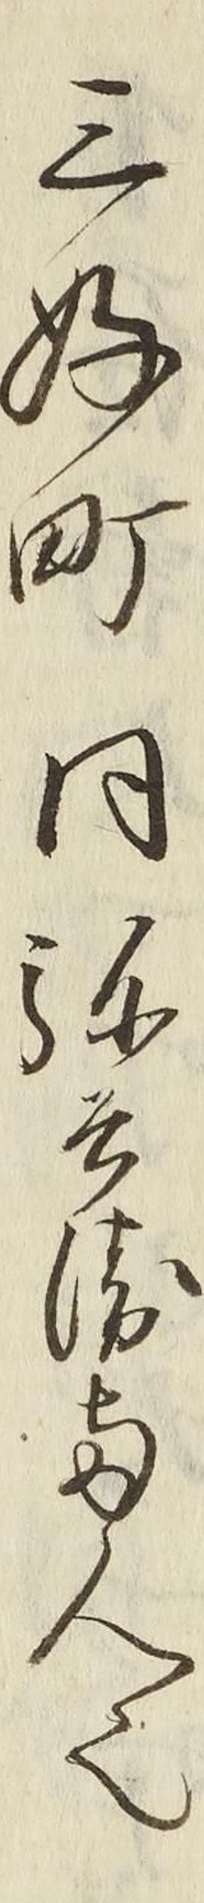三好町同弥兵衛両人也
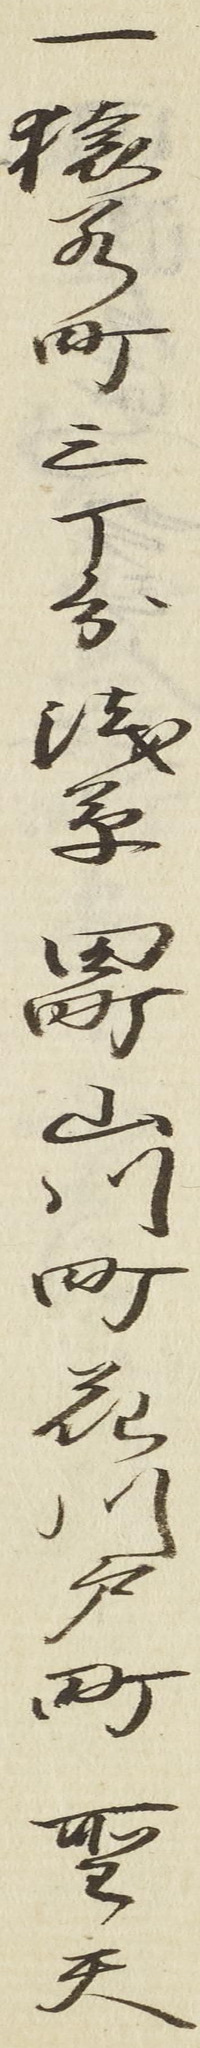一猿若町三丁分浅草田町山川町花川戸町聖天
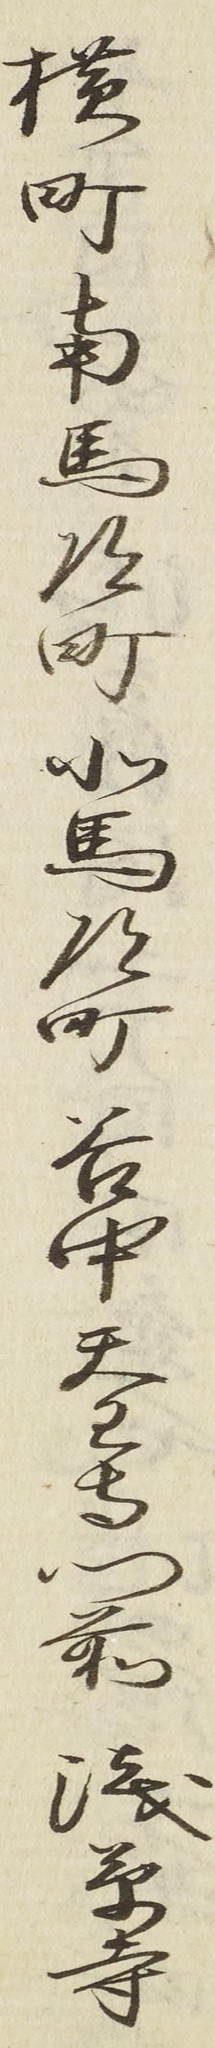横町南馬道町北馬道町谷中天王寺門前浅草寺
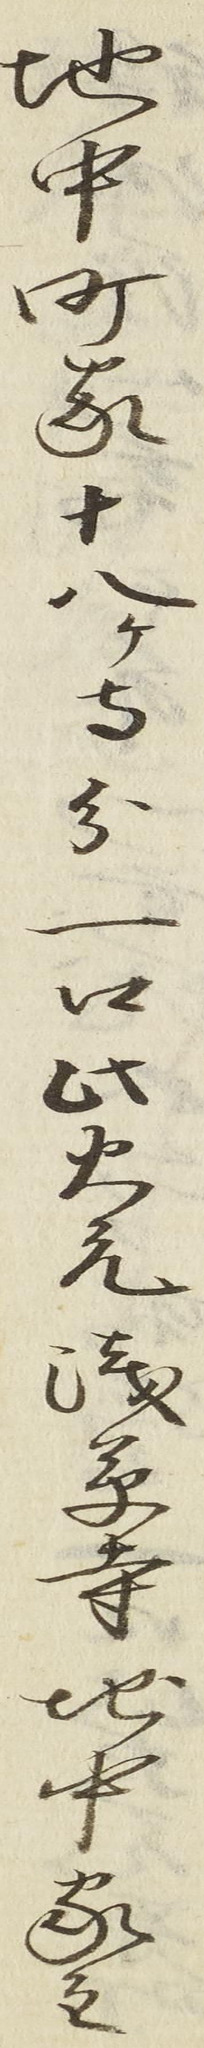地中町家十八ケ寺分一口此火元浅草寺地中家主
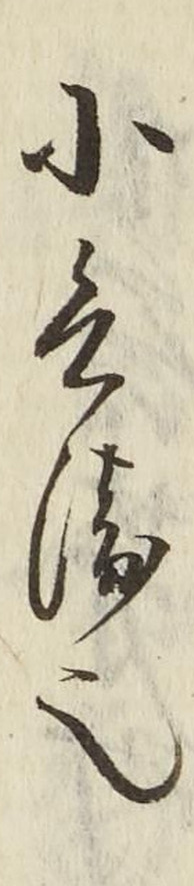小兵衛也
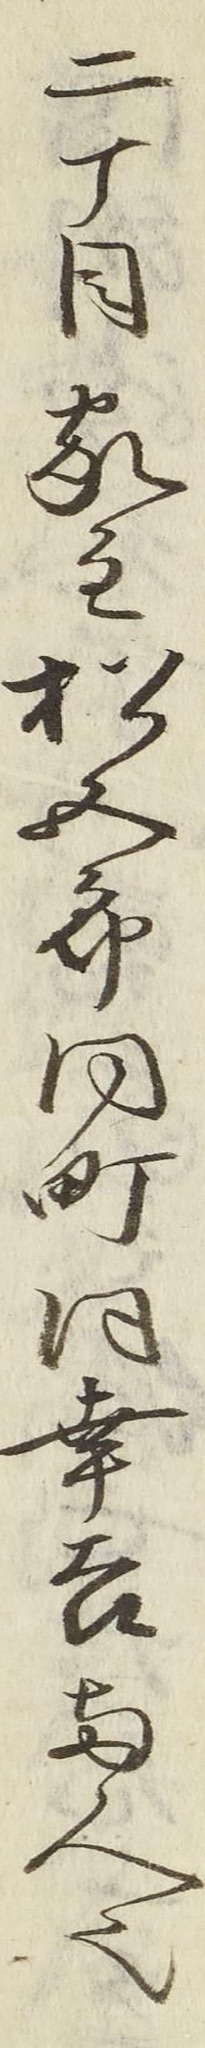二丁目家主松五郎同町同幸吉両人也
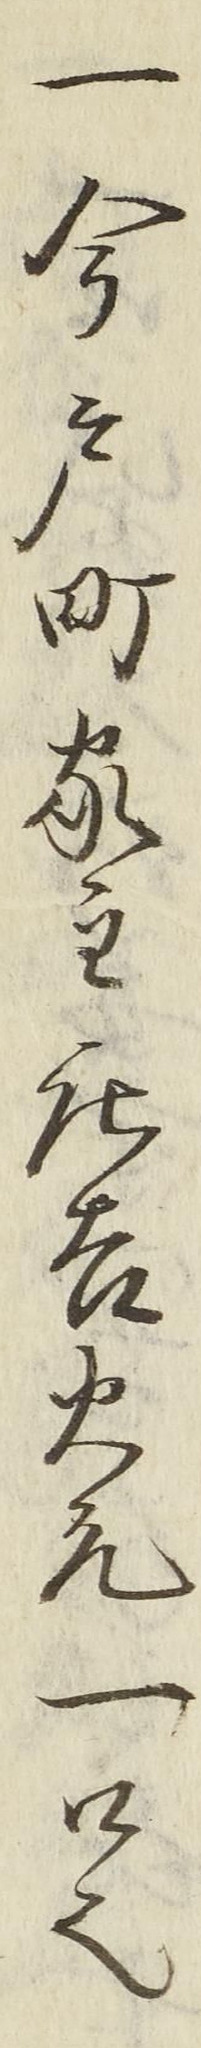一今戸町家主庄吉火元一口也

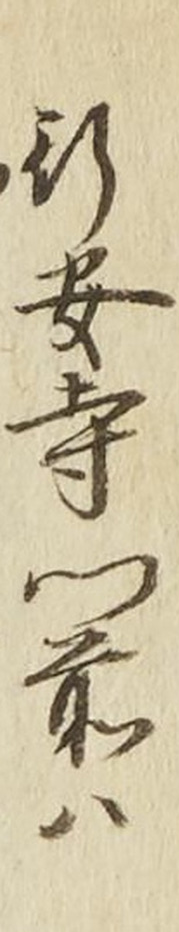行安寺門前は
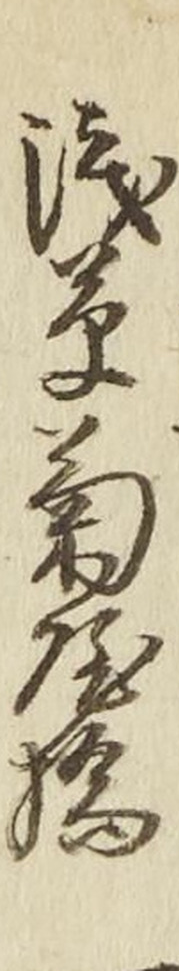浅草菊屋橋
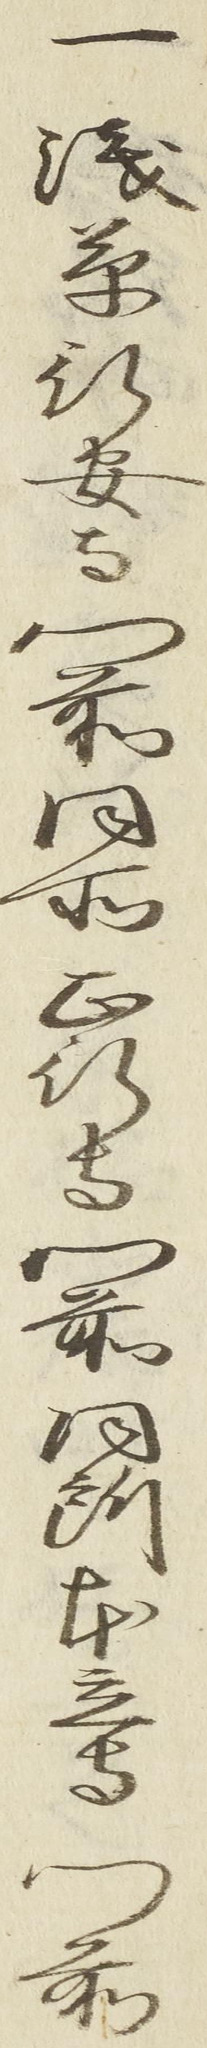一浅草行安寺門前同所正行寺門前同所本立寺門前
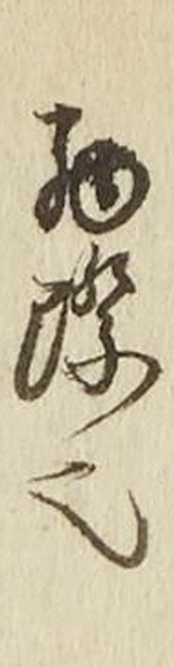西際也
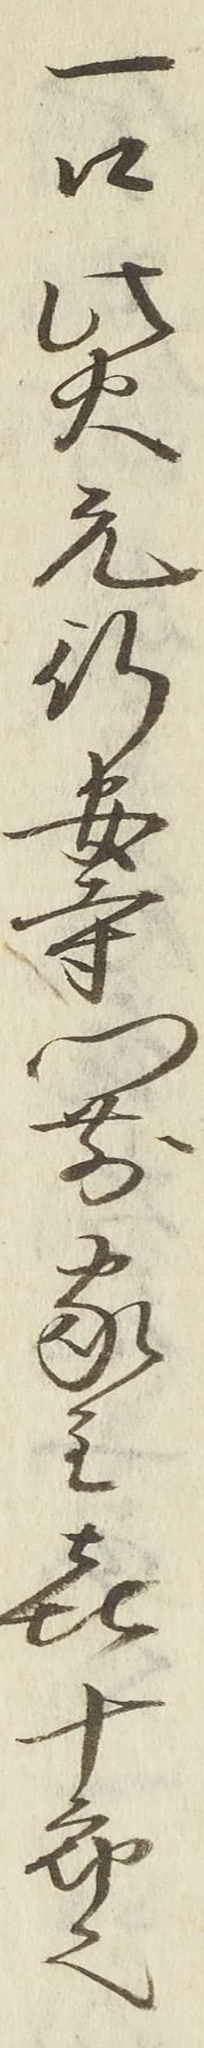一口此火元行安寺門前家主喜十郎也
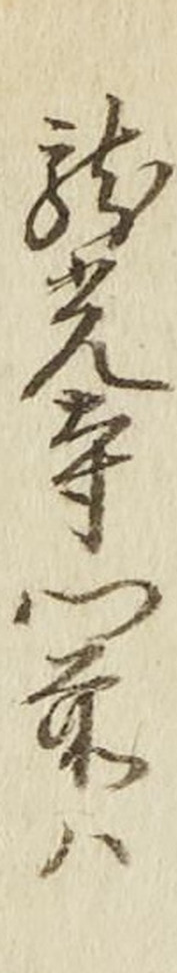龍光寺門前は
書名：やぶれ窓の記　全
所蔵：東京大学地震研究所図書室 Earthquake Research Institute Library, The University of Tokyo, JAPAN
